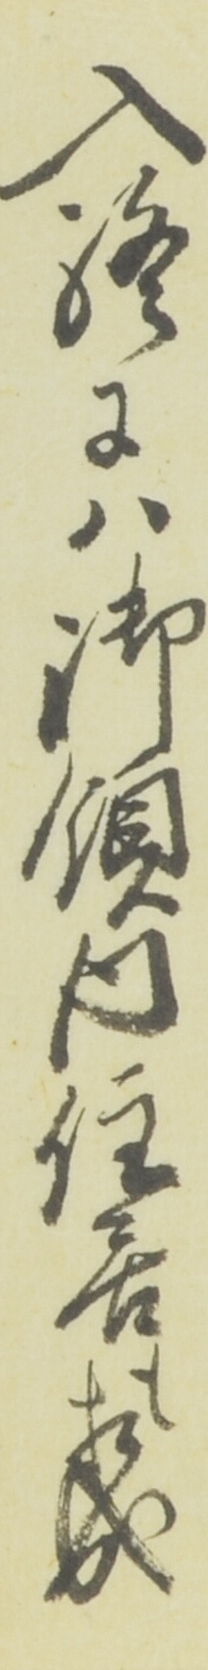入終にハ御領内住居も相成
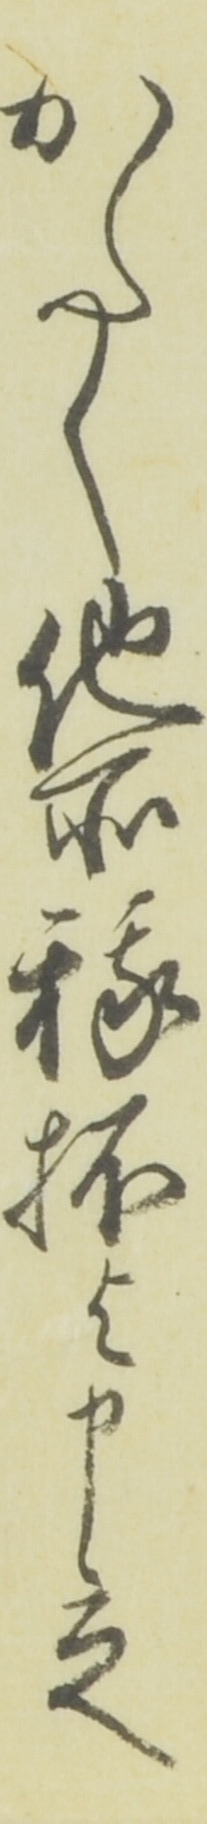かたく他所稼抔と申立
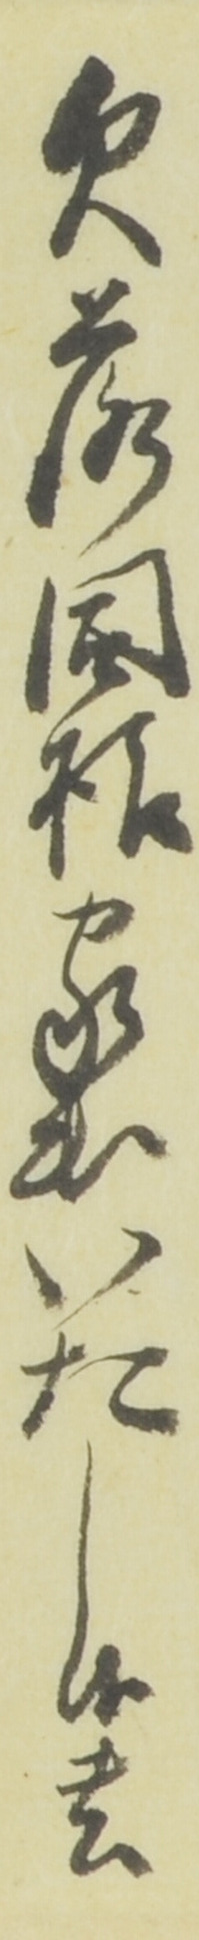欠落同様家出いたし候共
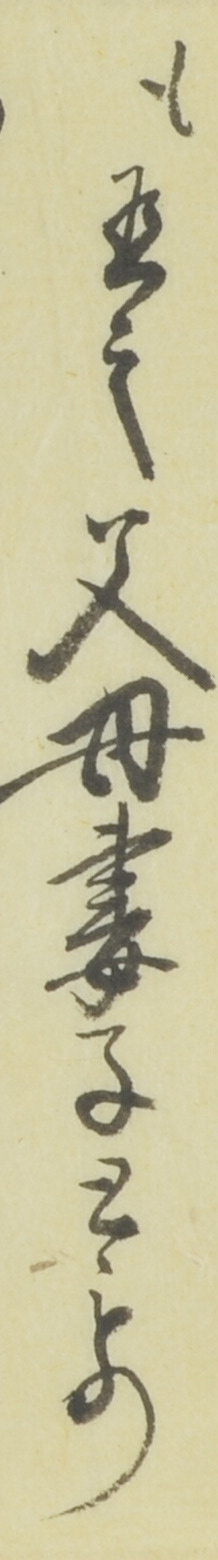も有之父母妻子ともの
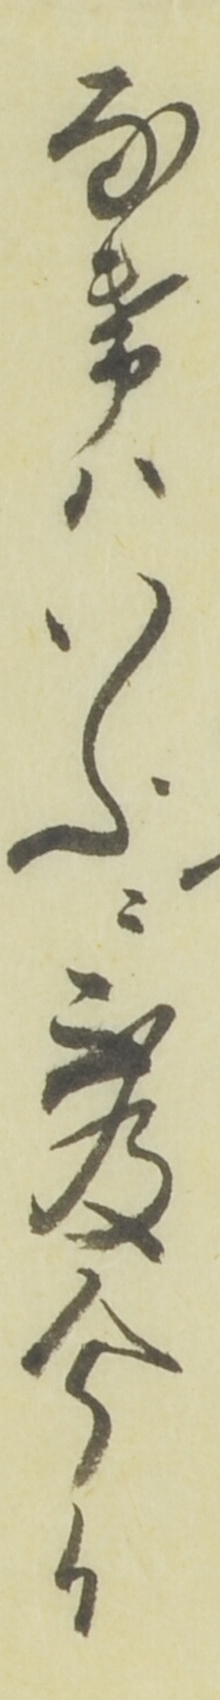なけハいふニ不及今日
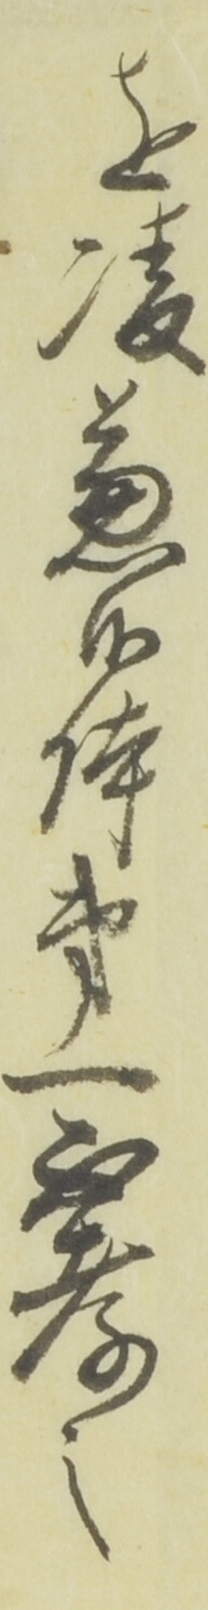を凌兼候体第一不孝之
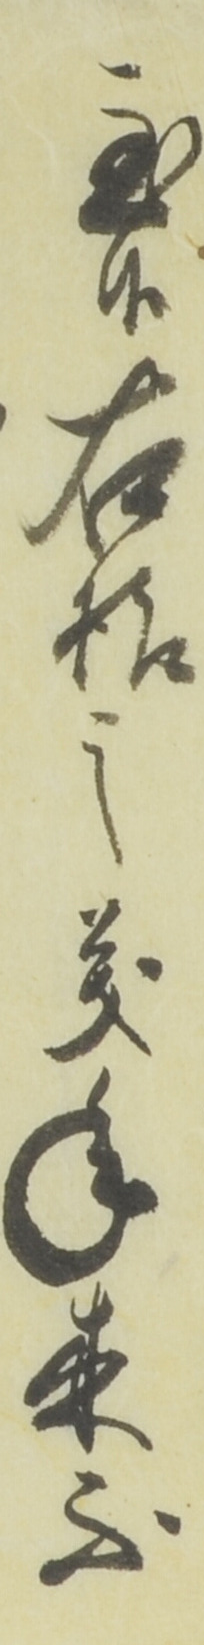至候右様之義手来不
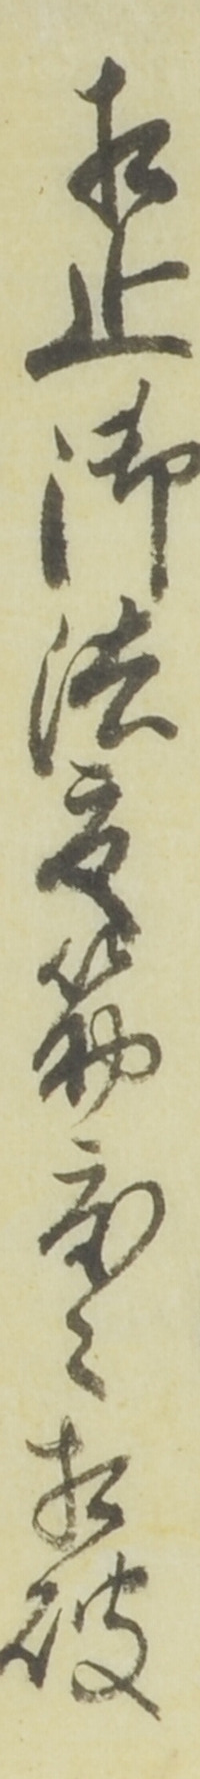相止御法度筋度々相破
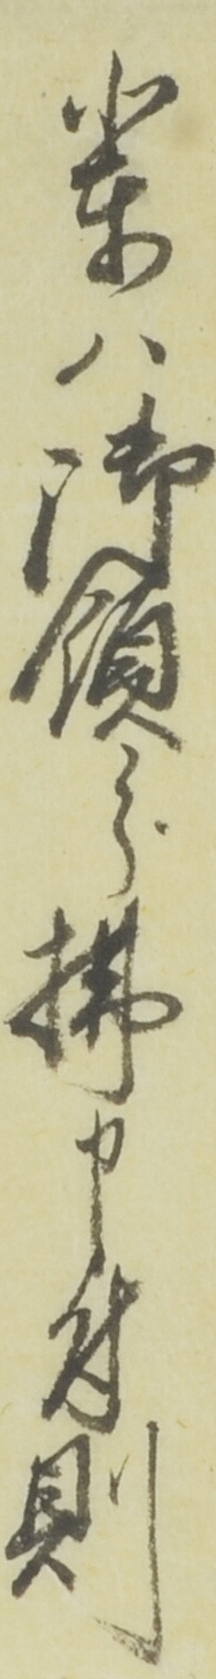輩ハ御領分払申付則
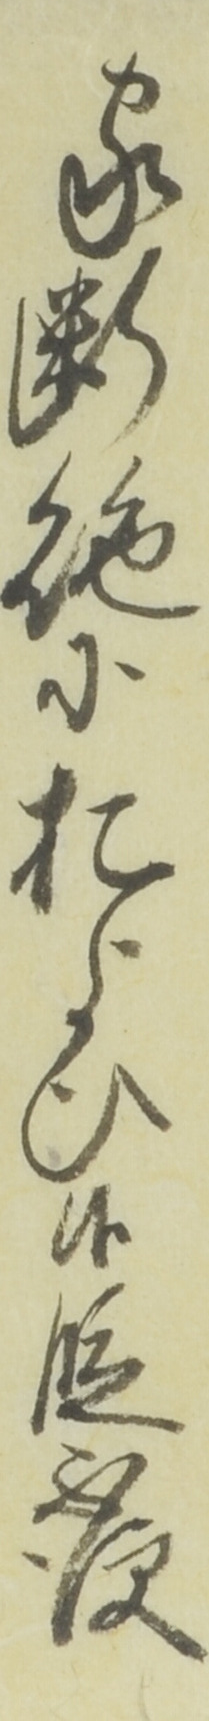家断絶におよひ候段不便
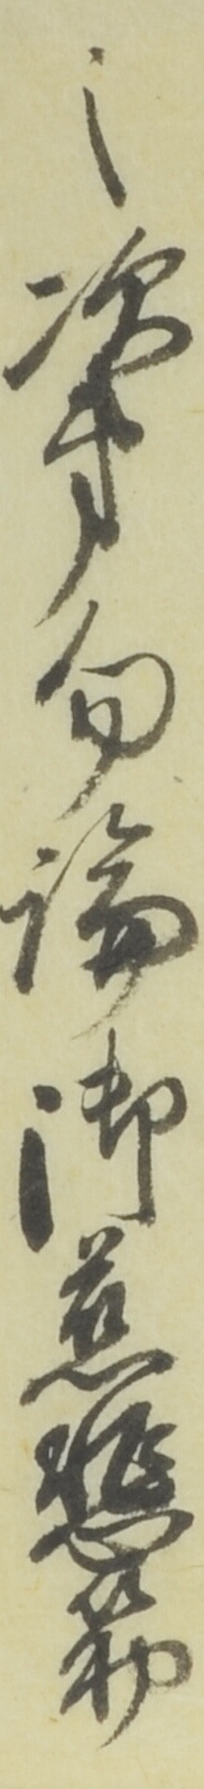之次第勿論御慈悲筋
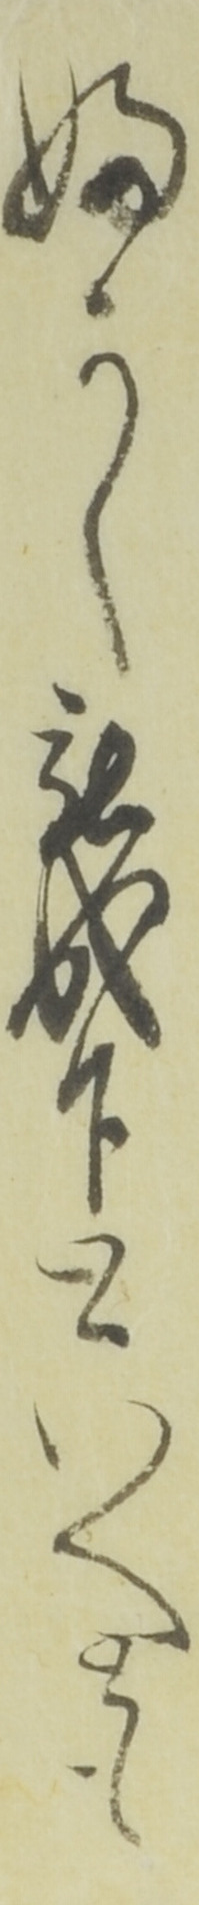ふかく被成下といへとも
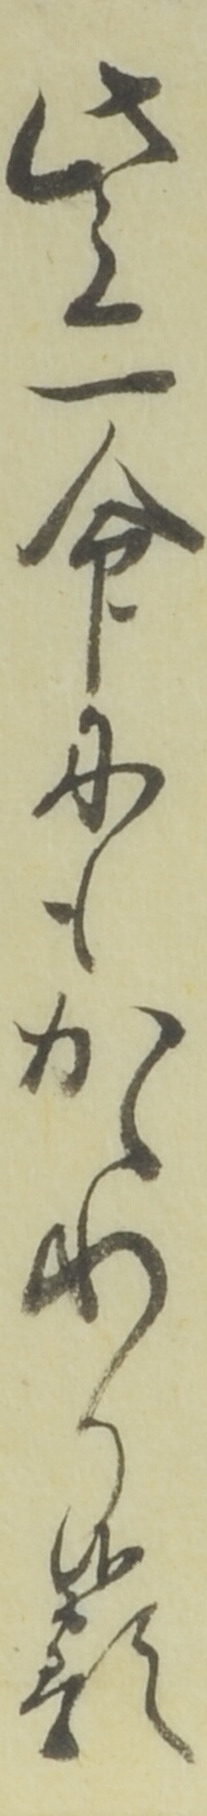此上一命にもかゝわり候類
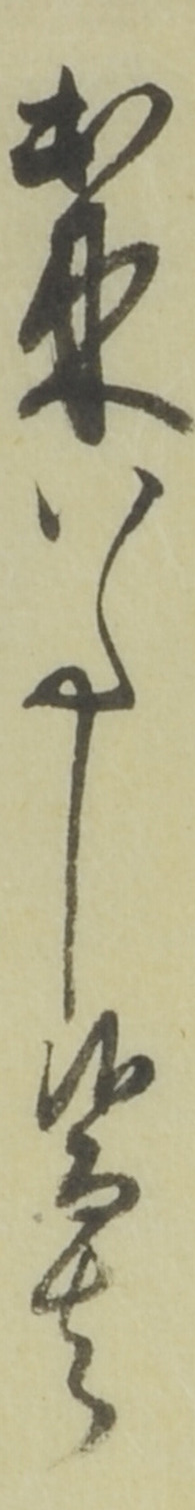出来いたし候而は
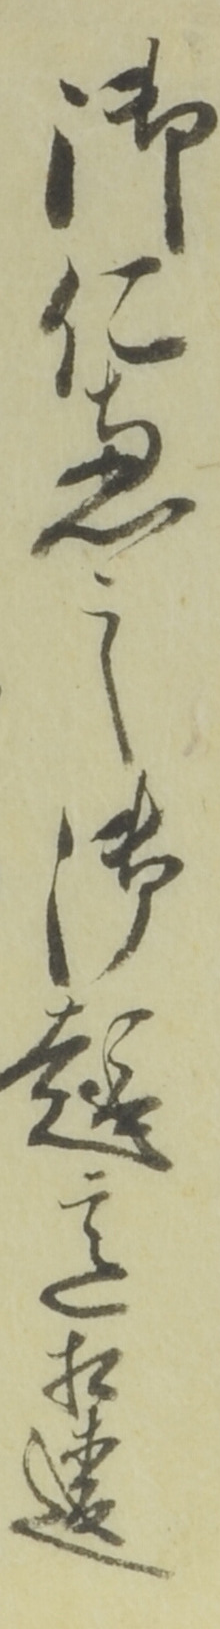御仁恵之御趣意相違
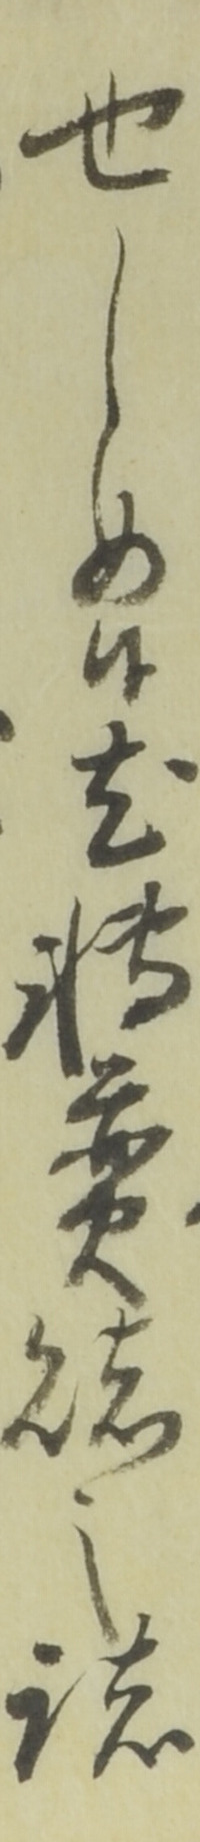せしめ候尤博奕賭之諸
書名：御触書御書附控
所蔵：伊那市立高遠町図書館・合同会社AMANE
